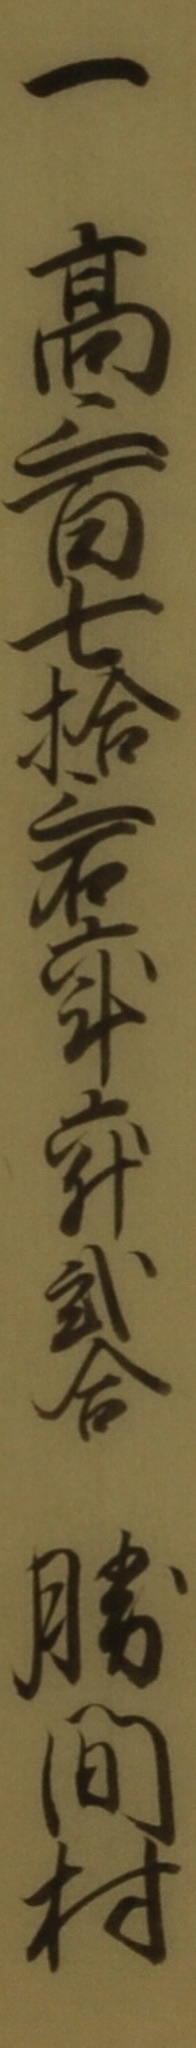一高三百七拾三石六斗六升弐合勝間村
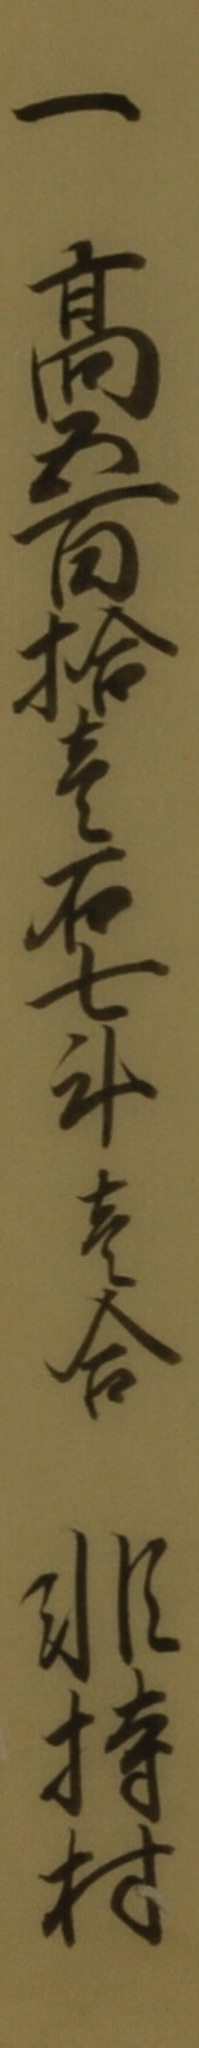一高五百拾壱石七斗壱合非持村

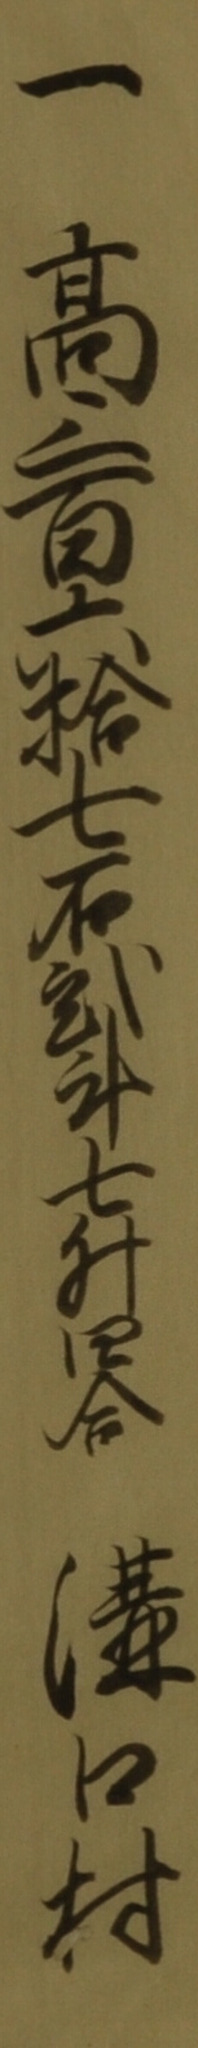一高三百六拾七石弐斗七升四合溝口村
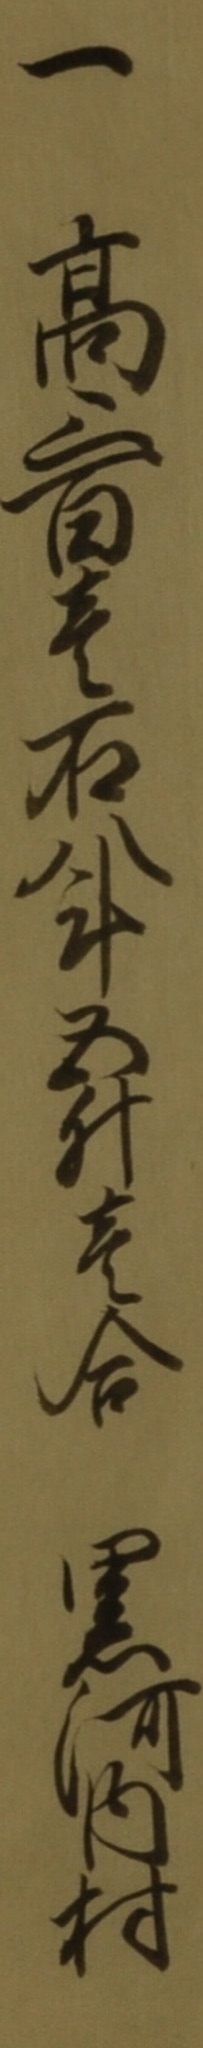一高三百壱石八斗五升壱合黒河内村
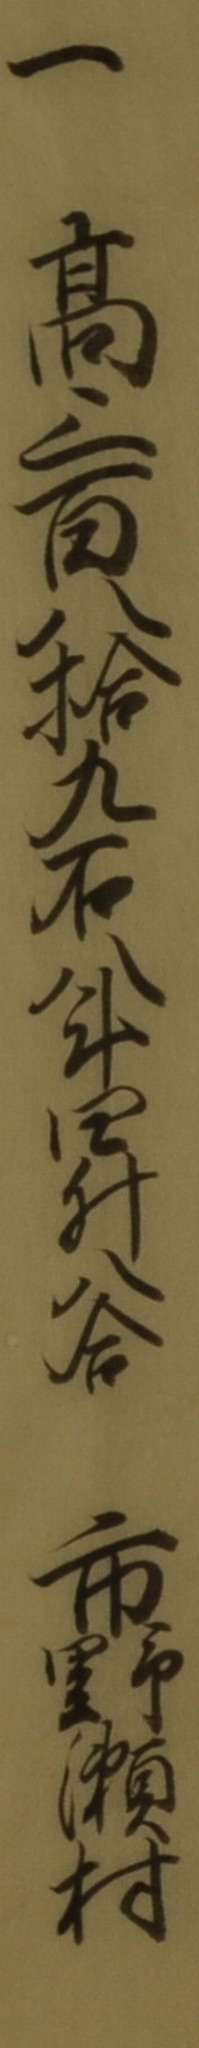一高三百八拾九石八斗四升八合市野瀬村
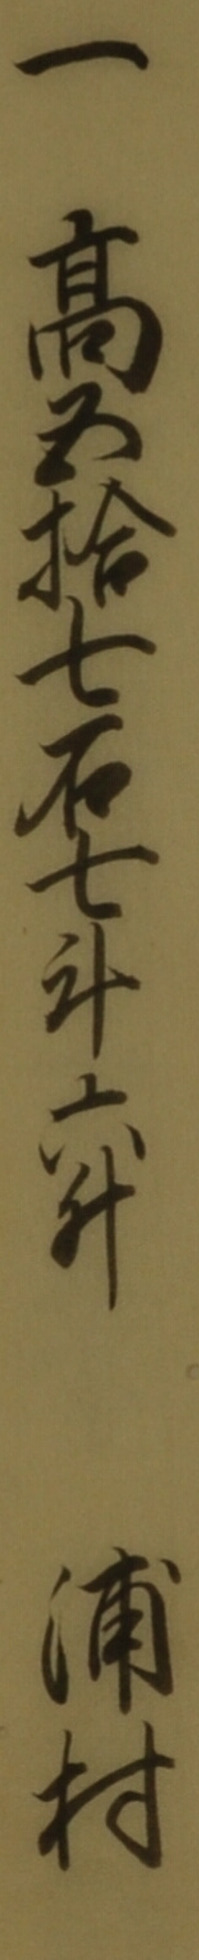一高五拾七石七斗六升浦村
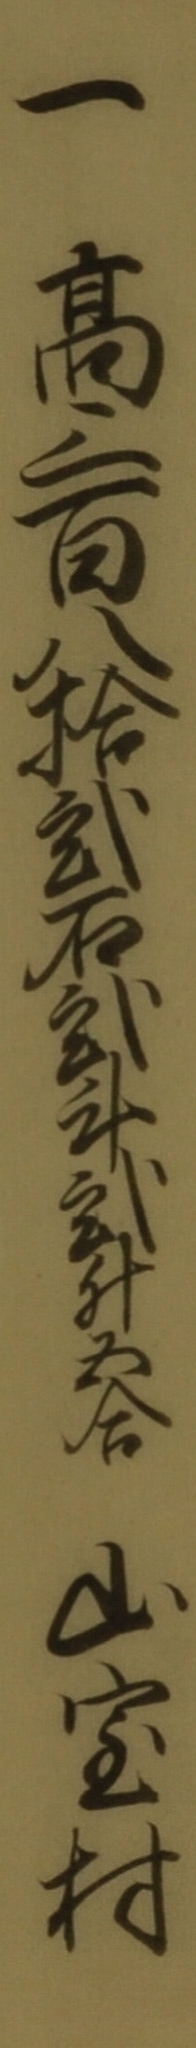一高三百八拾弐石弐斗弐升五合山室村
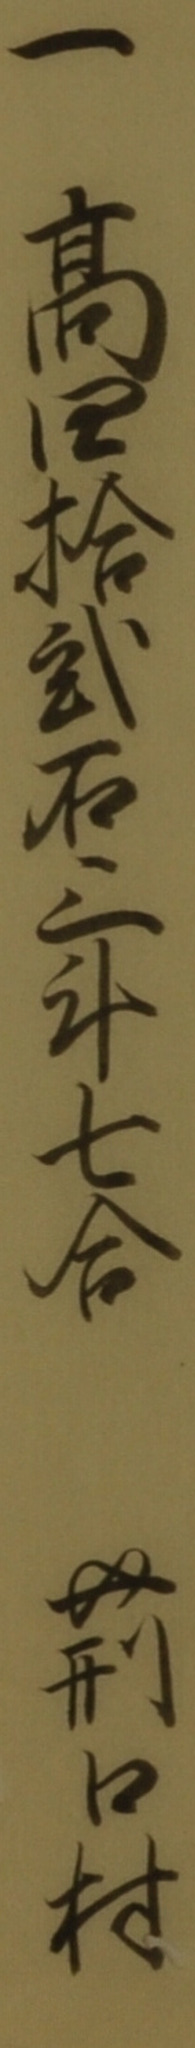一高四拾弐石三斗七合荊口村

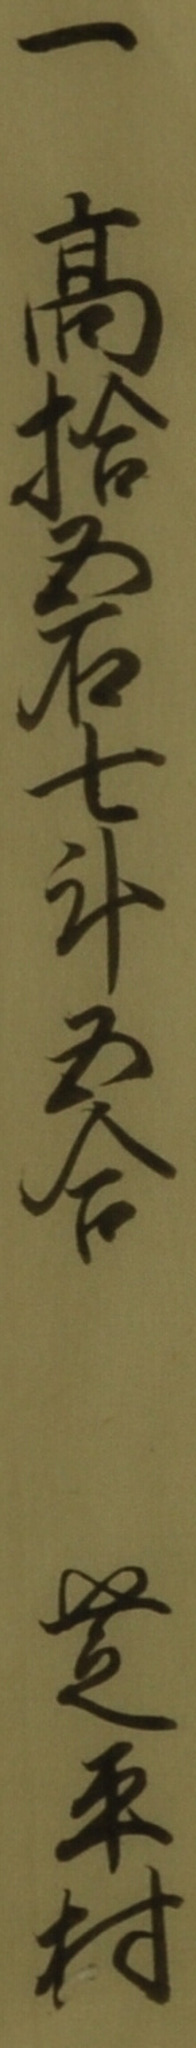一高拾五石七斗五合芝平村
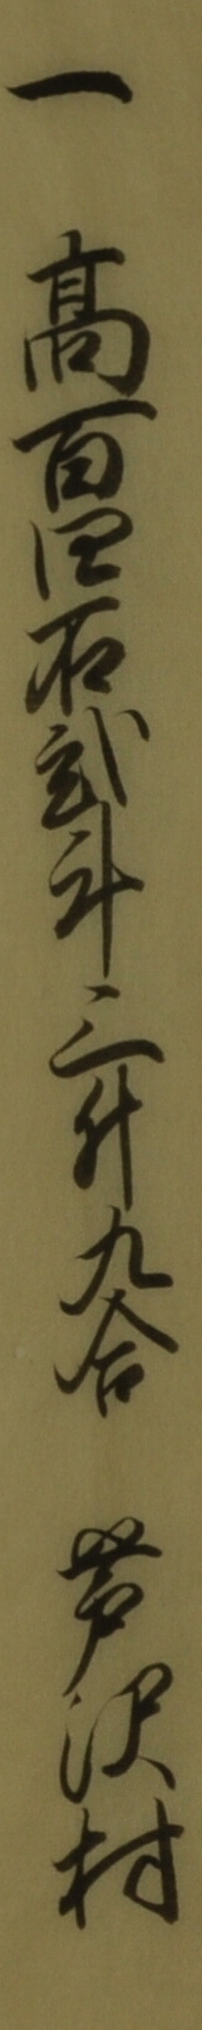一高百四石弐斗三升九合芦沢村
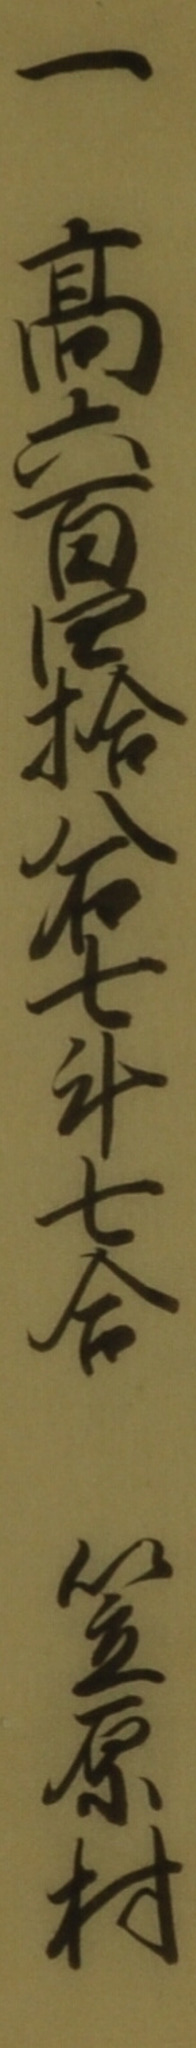一高六百四拾八石七斗七合笠原村
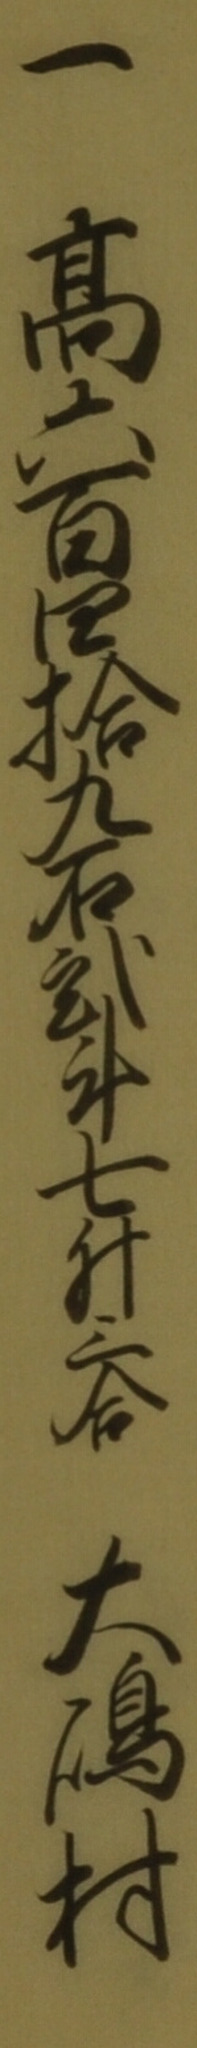一高六百四拾九石弐斗七升三合大島村
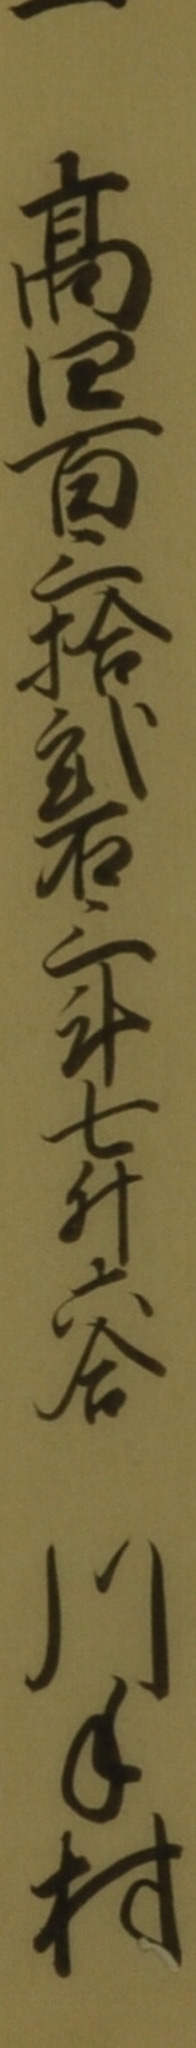一高四百三拾弐石三斗七升六合川手村

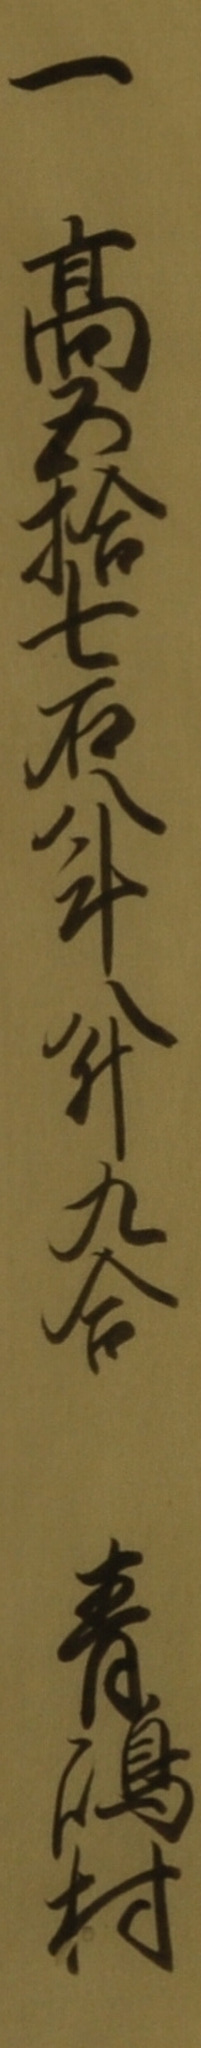一高五拾七石八斗八升九合青島村
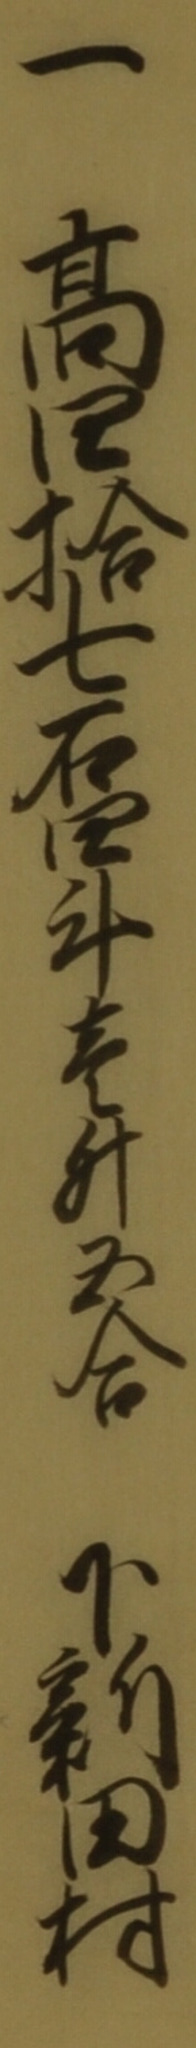一高四拾七石四斗壱升五合下新田村
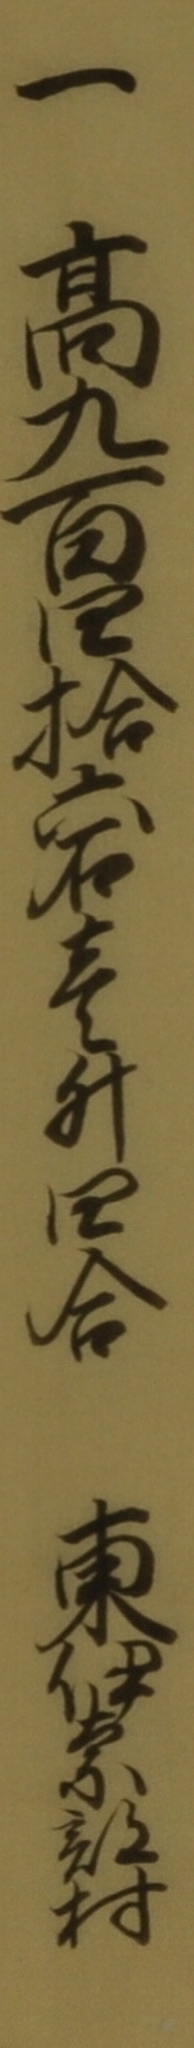一高九百四拾六石壱升四合東伊奈部村
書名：信濃国伊那郡筑摩郡高遠領知郷村高辻帳
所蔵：伊那市立高遠町図書館・合同会社AMANE
